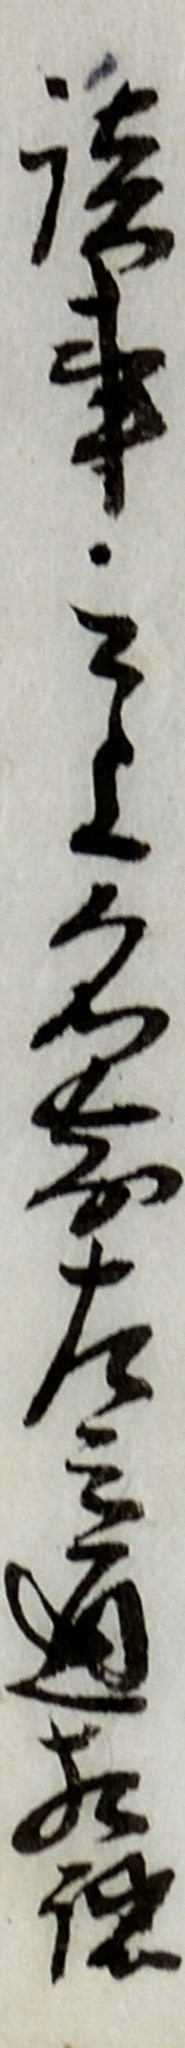談事之上名前左之通相認
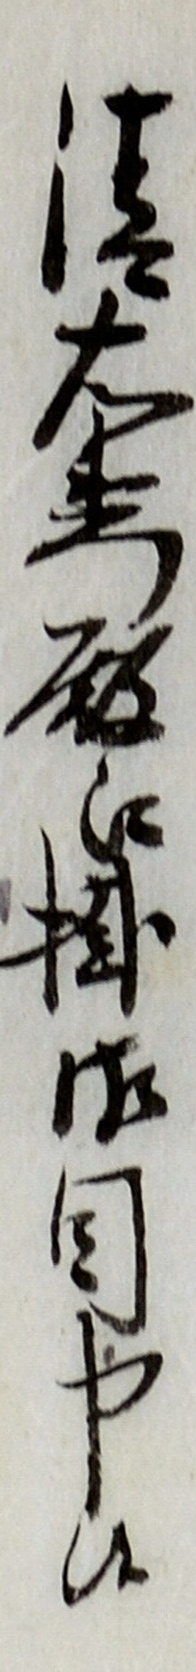清右衛門殿え掛御目申候
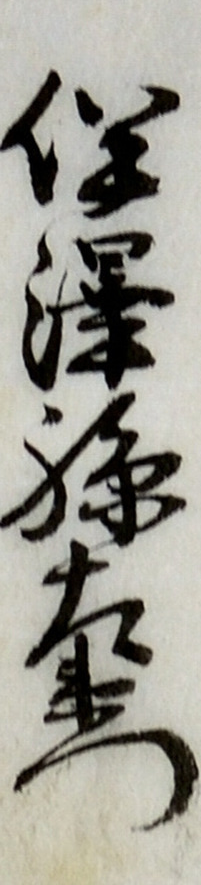伊沢孫左衛門
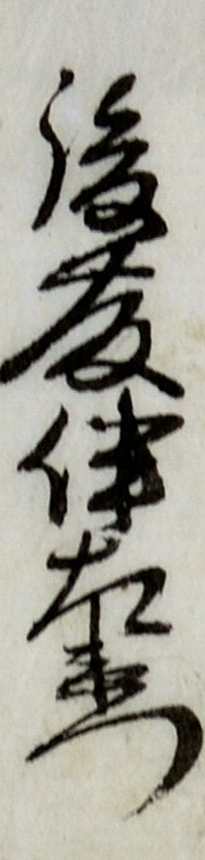後藤伴左衛門
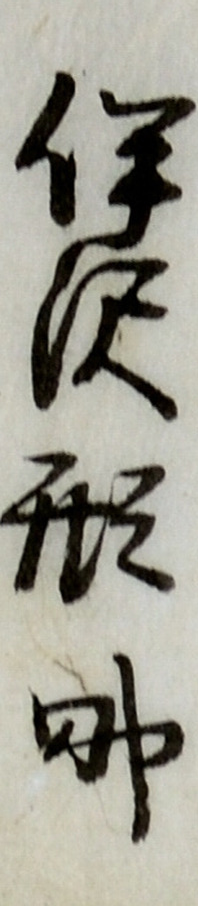伊沢形助
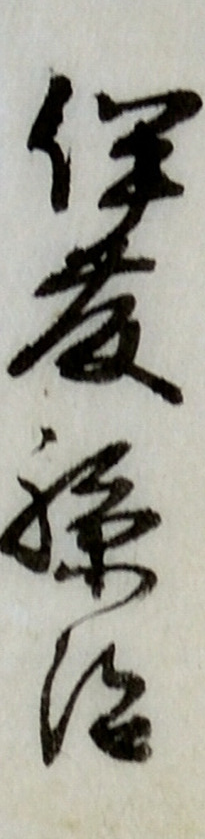伊藤孫治
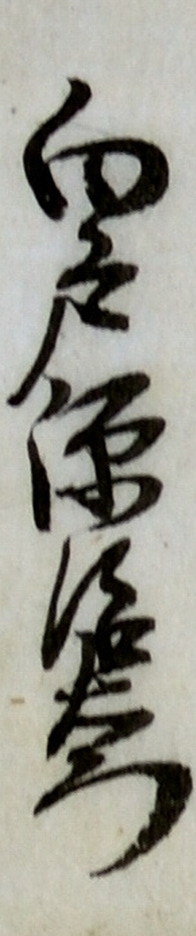白戸源治右衛門
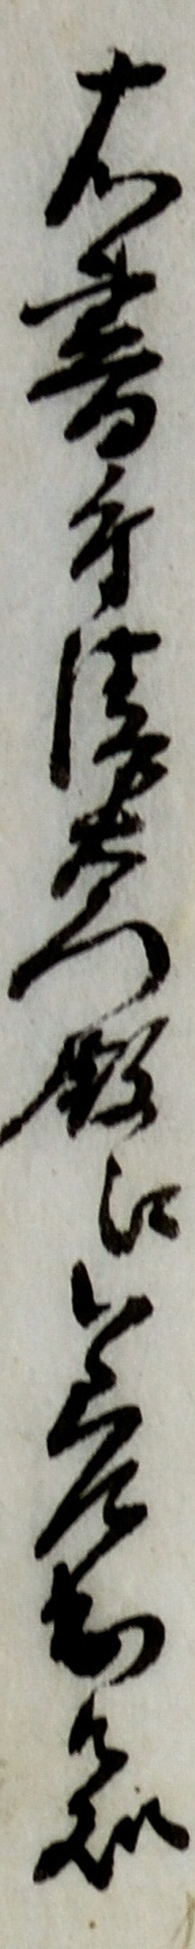右書付清右衛門殿え差出候処
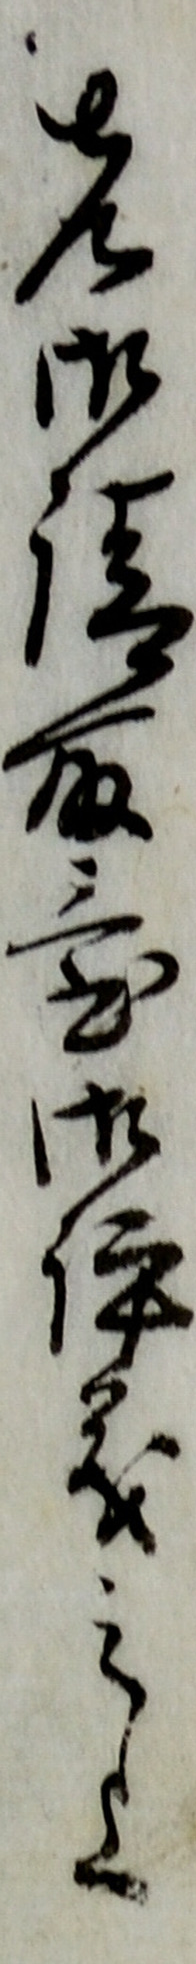先御請取置御評義之上
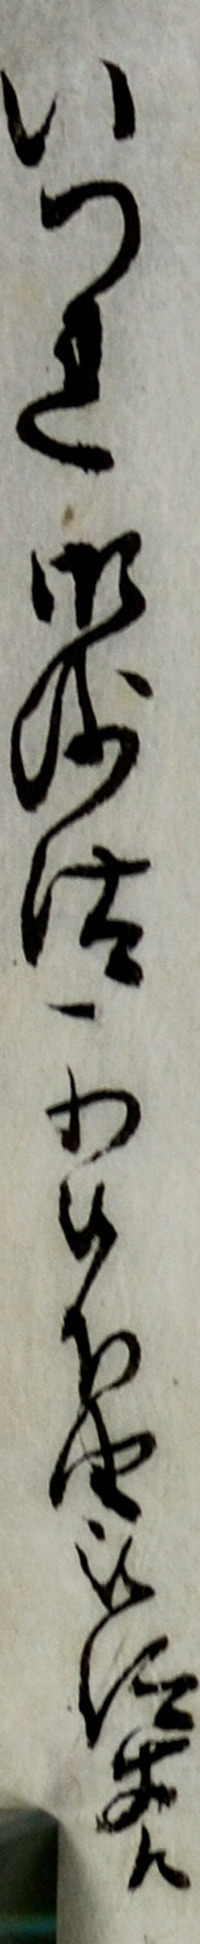いつれ御沙汰可被下由被仰聞候

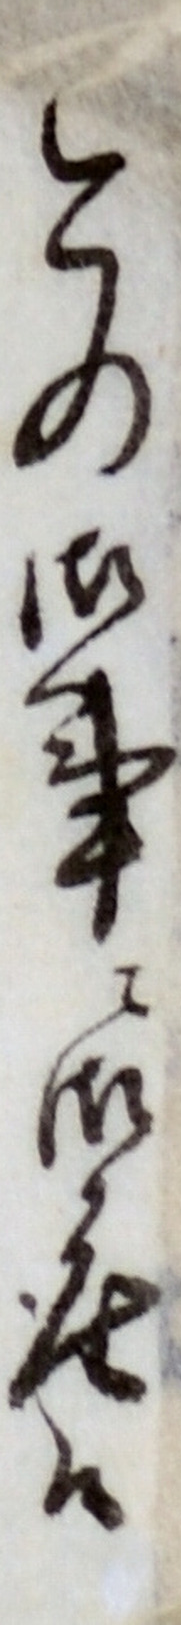との御事に御座候
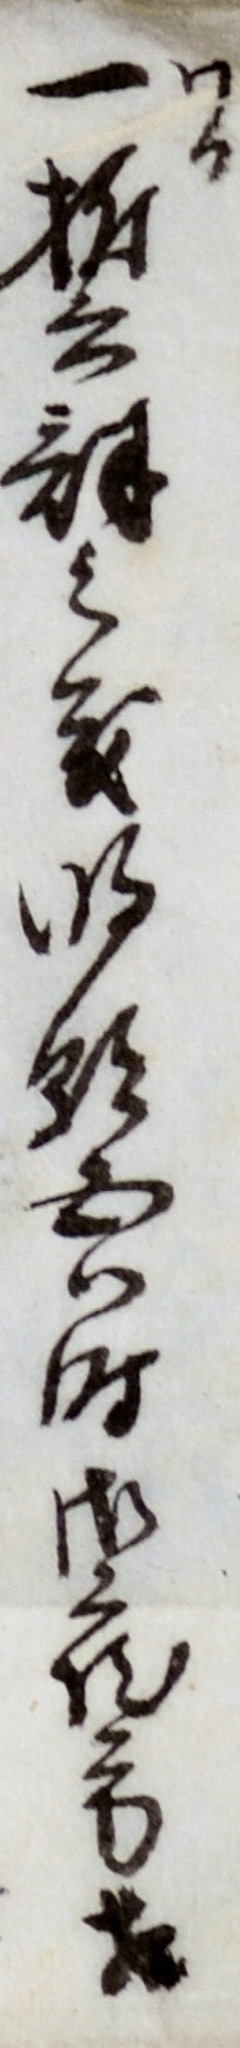一誓詞之義明朝五ツ時御蔵方相
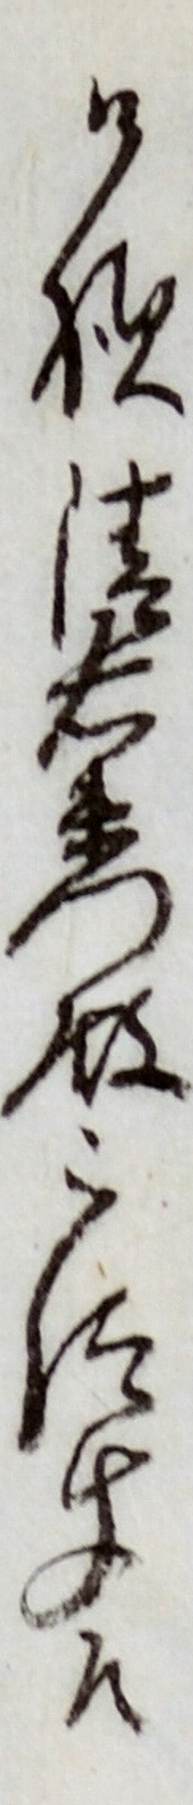候様清右衛門殿被仰聞候
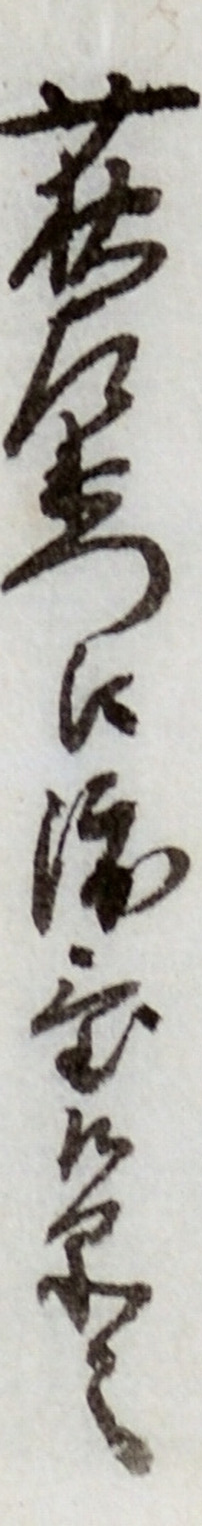萩左衛門え渡置候品々
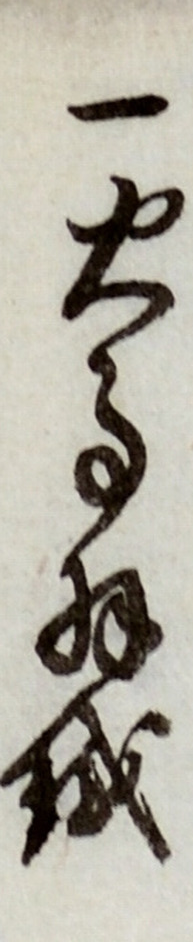一火事羽織
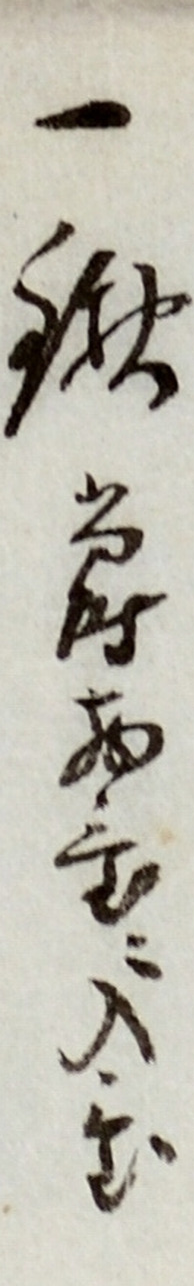一鍬当時物置に入置
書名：諸事御用留帳
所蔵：伊那市立高遠町図書館・合同会社AMANE
